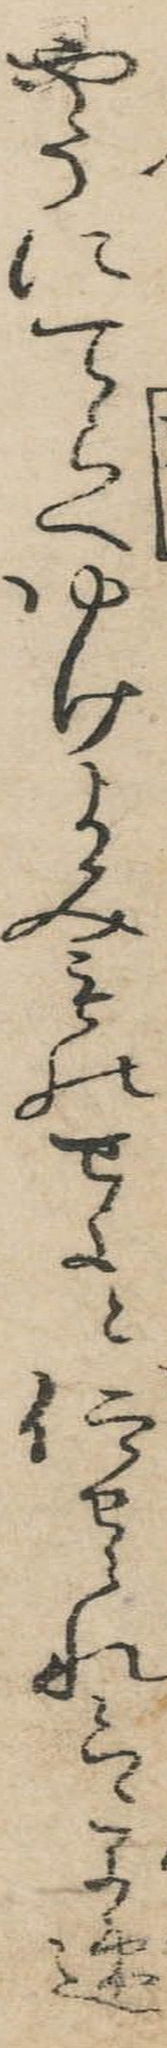やうにてらへゆけよみものせよと仰せられ候はゝ早速
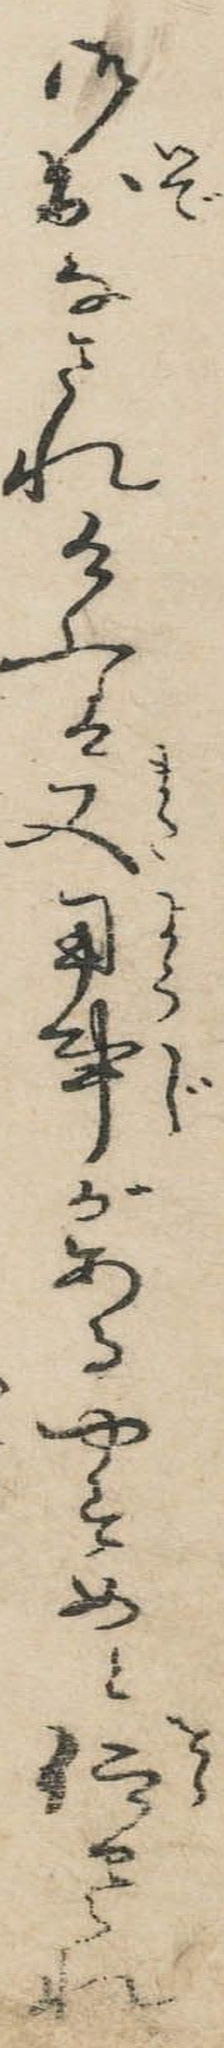御出なされけふは又用事があるやすめと仰せられ
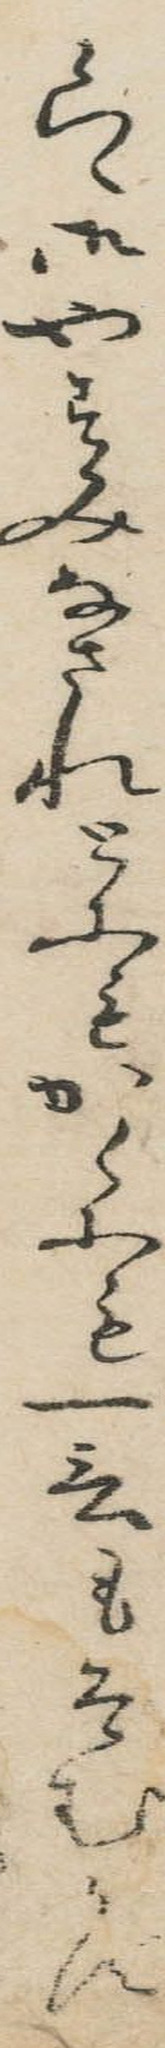候はゝ御やすみなされとにもかくにも一言もそむかず
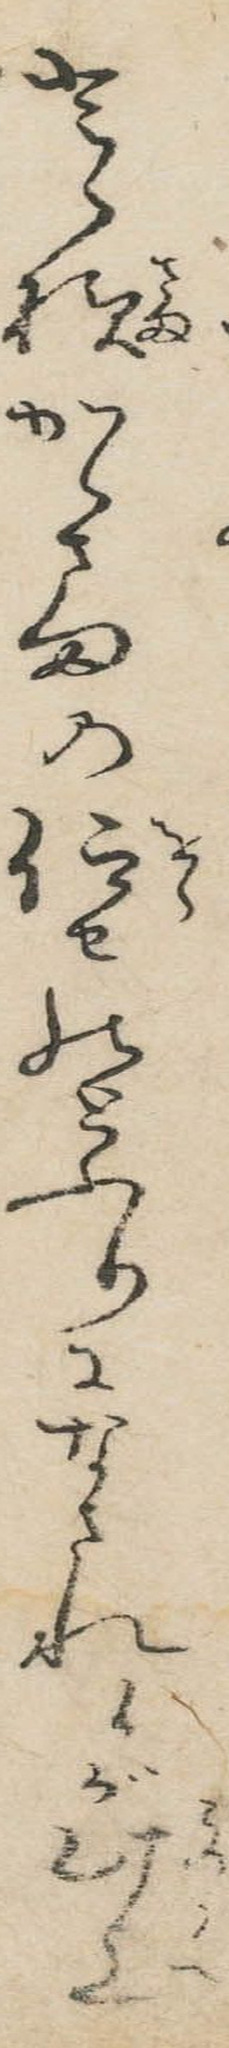とゝ様かゝさまの仰せのとふりになされ候が此上
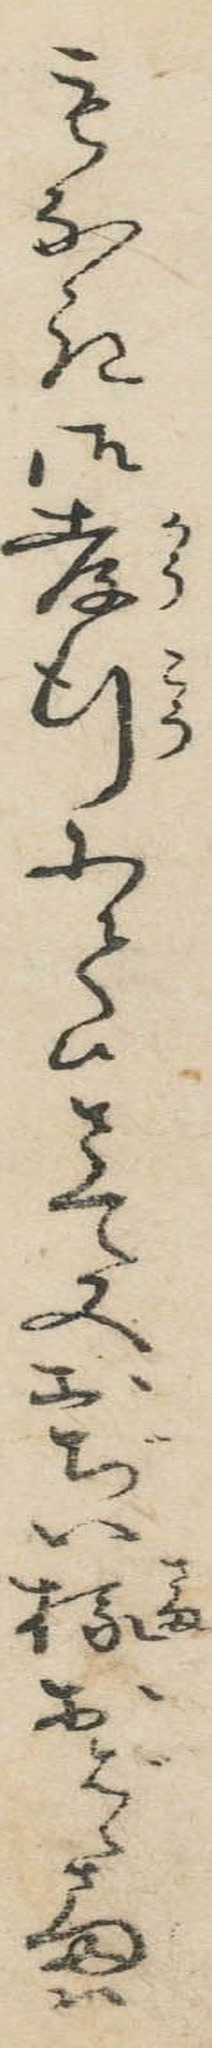もなき御孝行にて候さて又おぢい様おばゝさまは
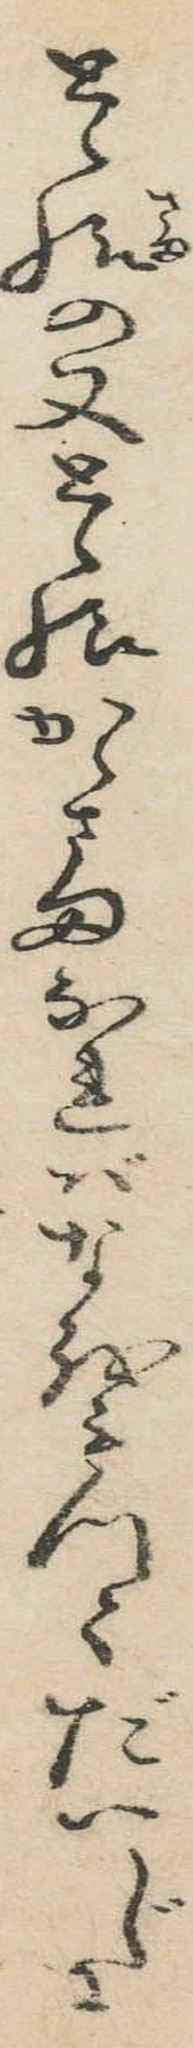とゝ様の又とゝ様かゝさまなればなをもつてだいじに
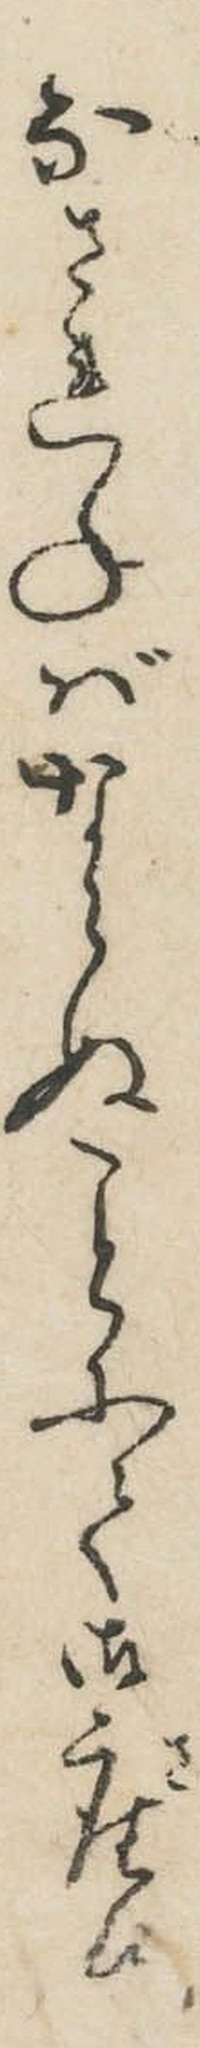なされねばならぬことにて御座候
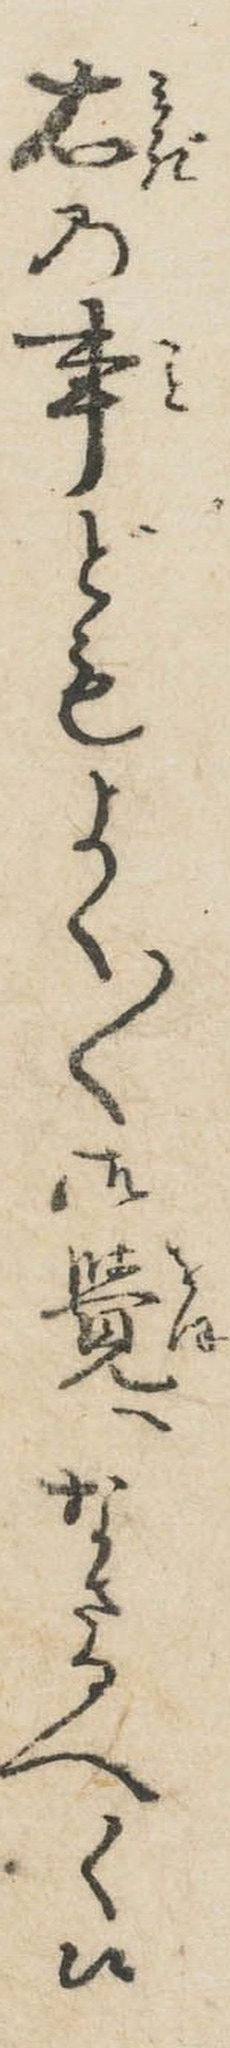右の事どもよく〳〵御覚へなさるへく候
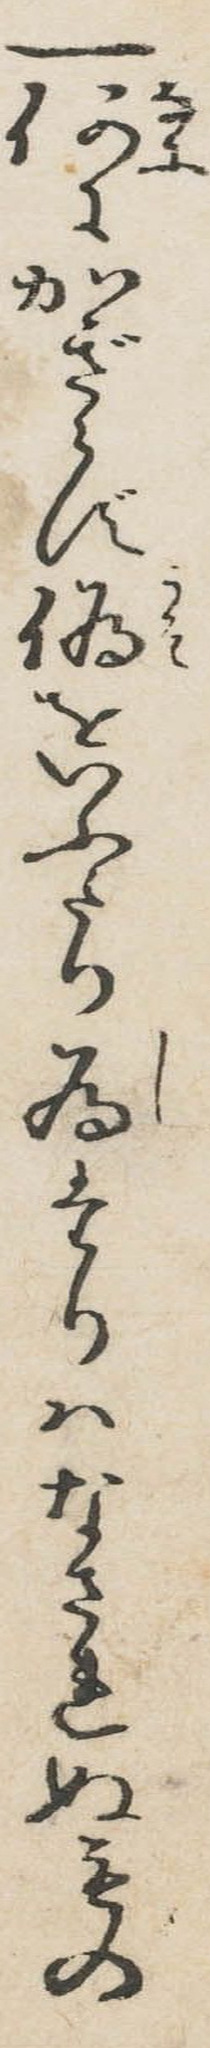一何にかぎらず偽をいふたり為たりはなされぬもの
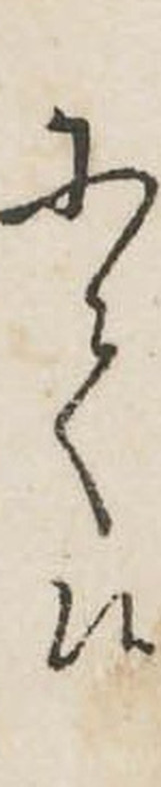にて候
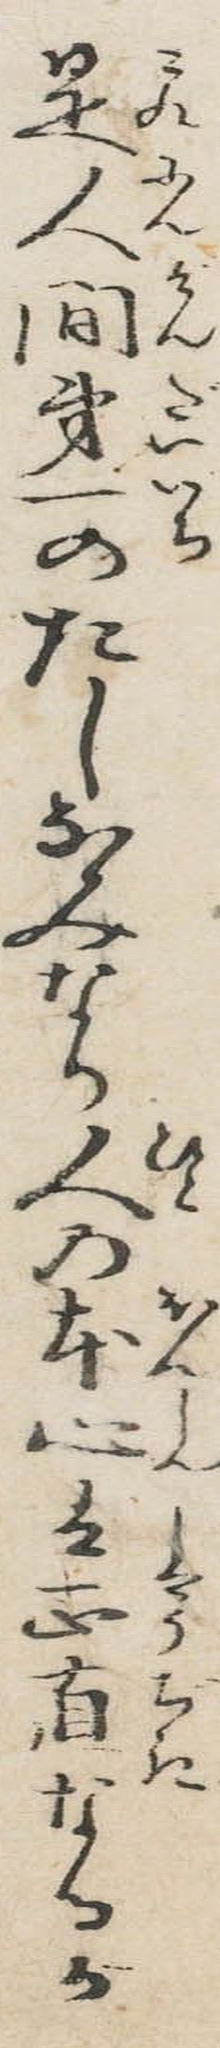是人間第一のたしなみなり人の本心は正直なるが
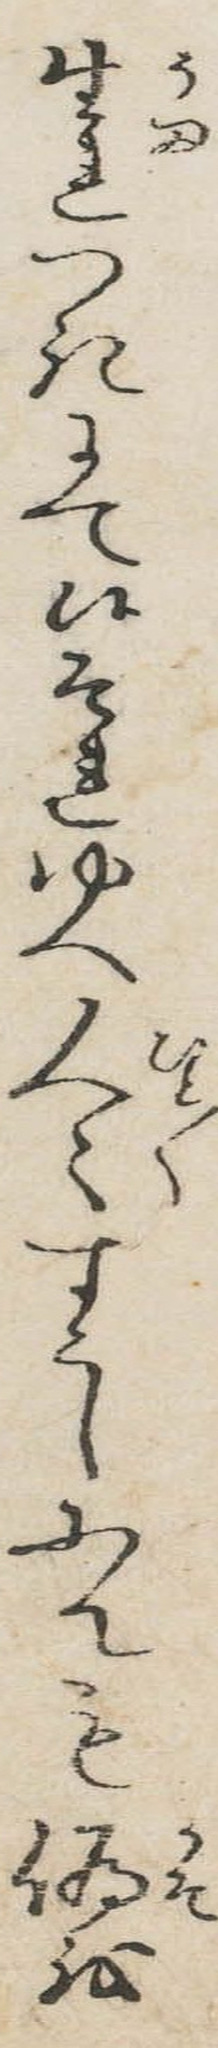生れつきにて候それゆへひ人々すこしにても偽を
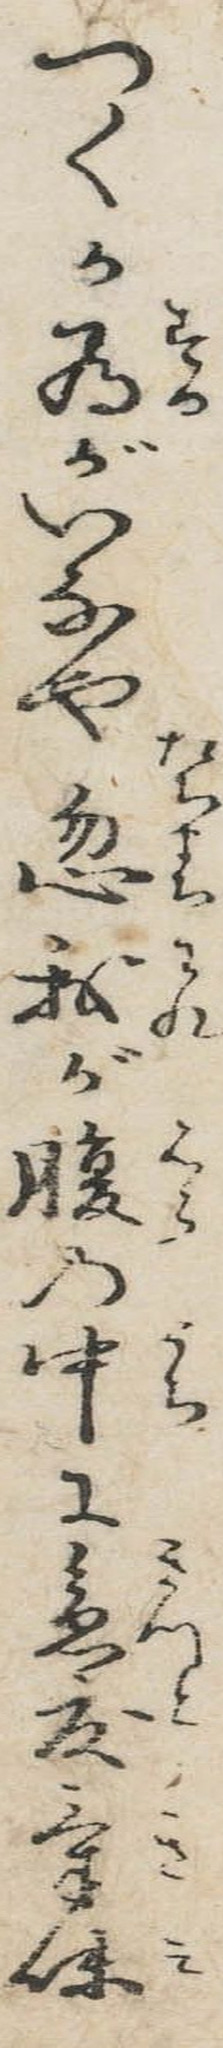つくかうい為がいなや忽我が腹の中に急度気味
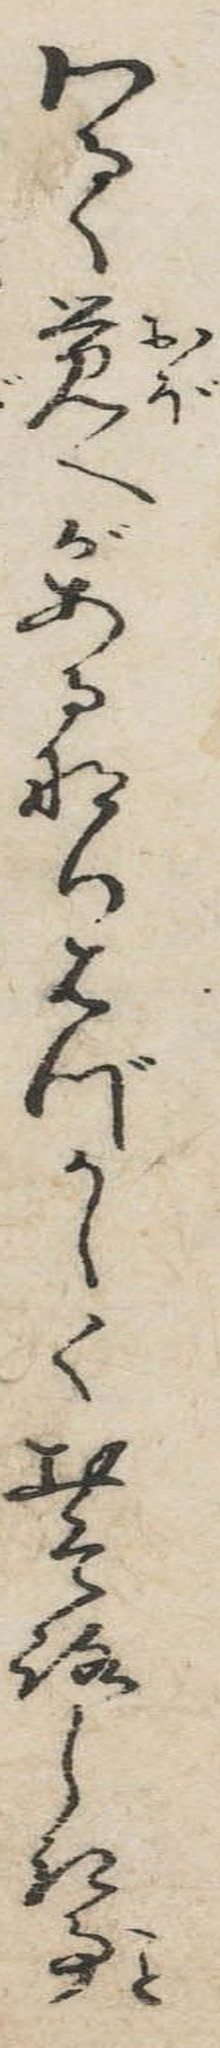わるく覚へがあるなかはづかしくおそろしき事
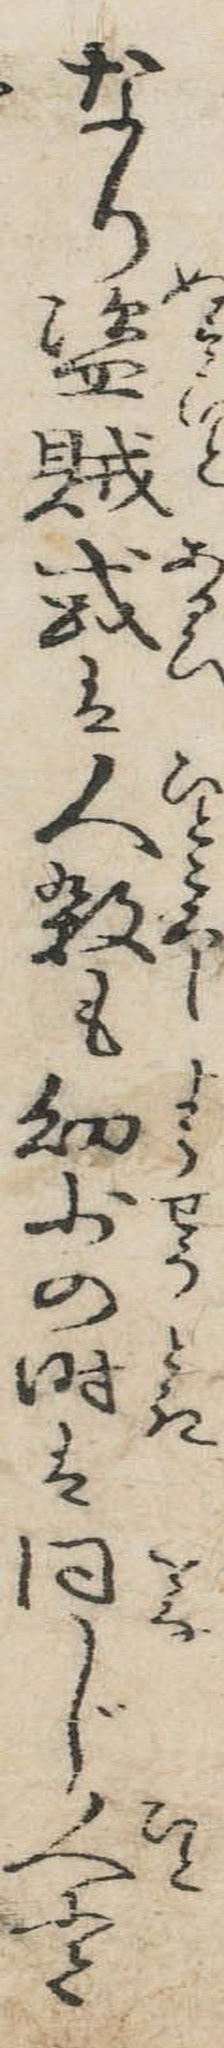なり盗賊或は人殺も幼少の時は同じ人にて
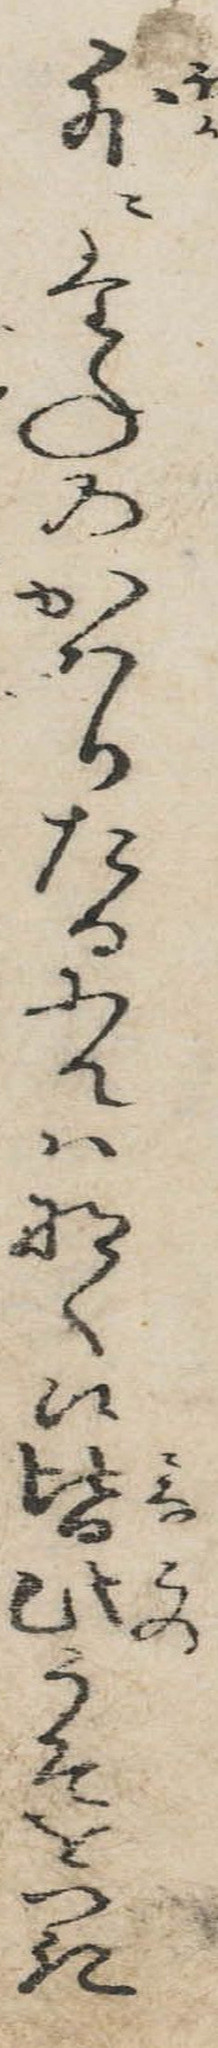外にたねのかわりたるにてはなく皆此うそをつき
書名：前訓
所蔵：東京学芸大学附属図書館
